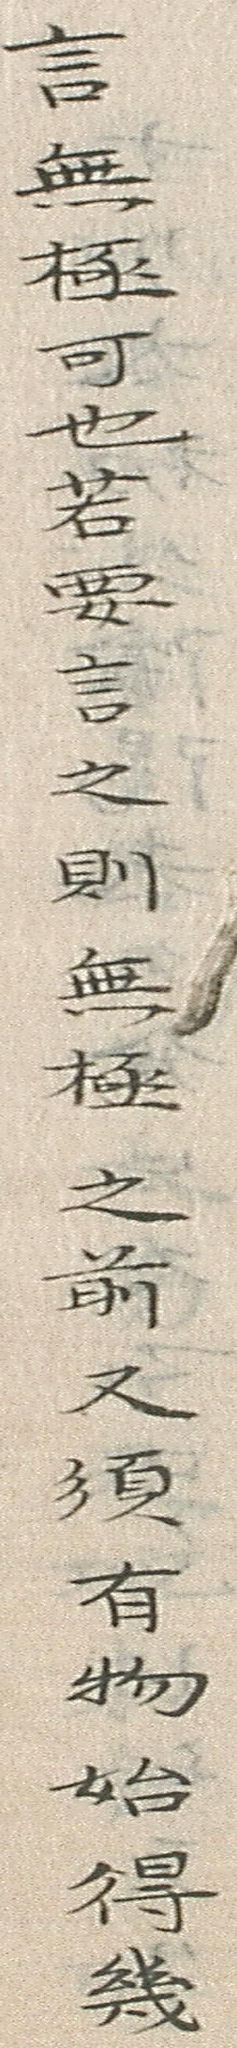言無極可也若要言之則無極之前又須有物始得幾
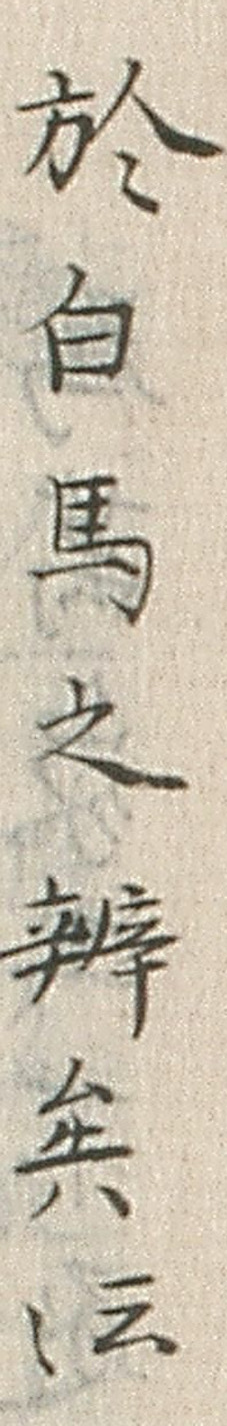於白馬之弁矣云〻
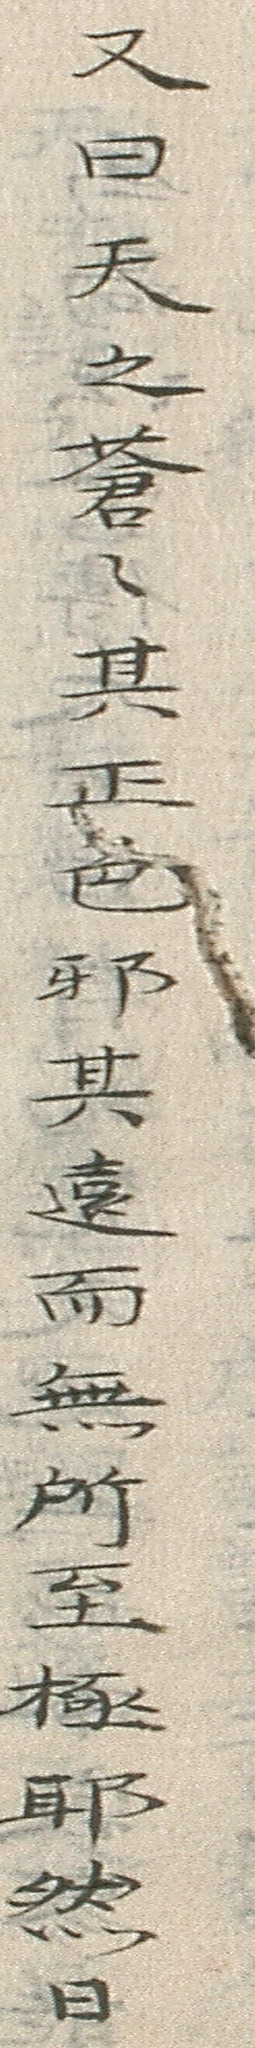又曰天之蒼〻其正色耶其遠而無所至極耶然日
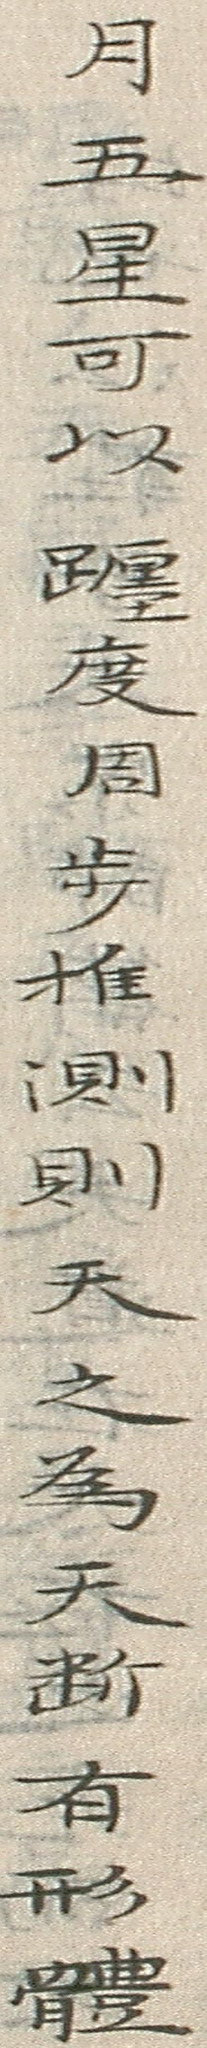月五星可以躔度周歩推測則天之為天断有形体
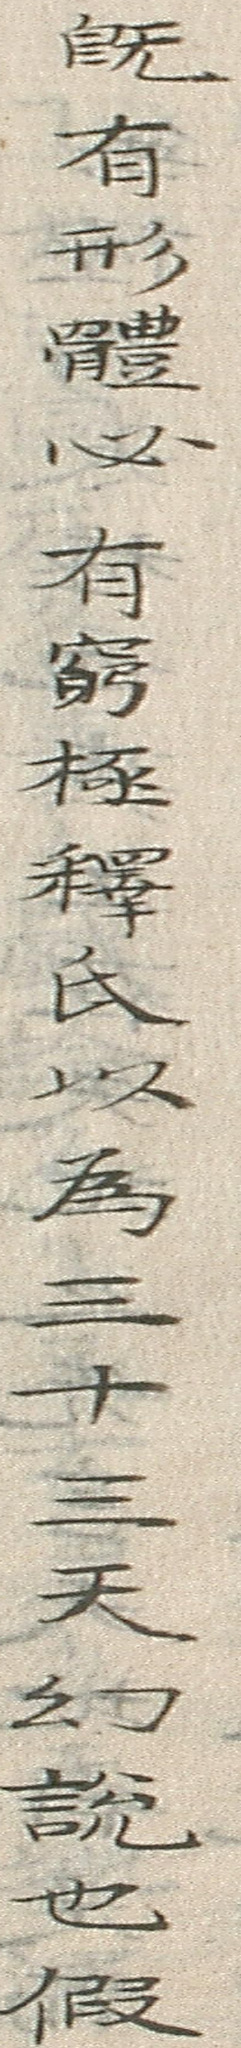既有形体必有窮極釈氏以為三十三天幻説也仮
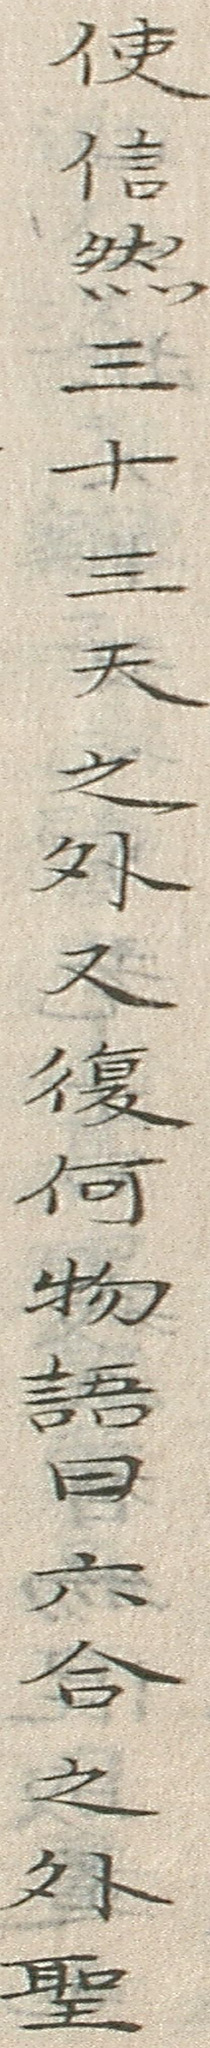使信然三十三天之外又復何物語曰六合之外聖
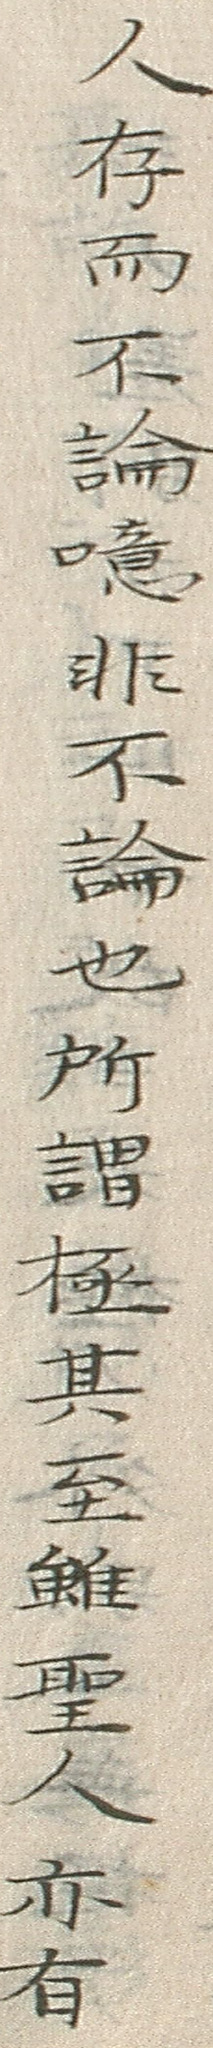人存而不論噫非不論也所謂極其至雖聖人亦有
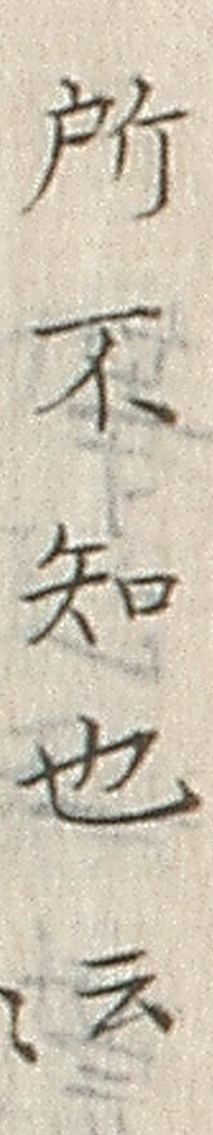所不知也云〻
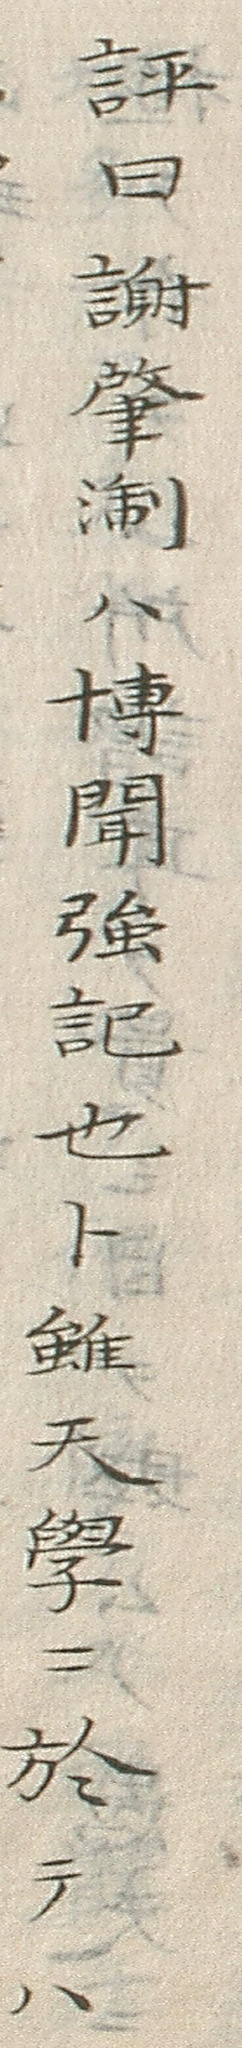評曰謝肇淛ハ博聞強記也ト雖天学ニ於テハ
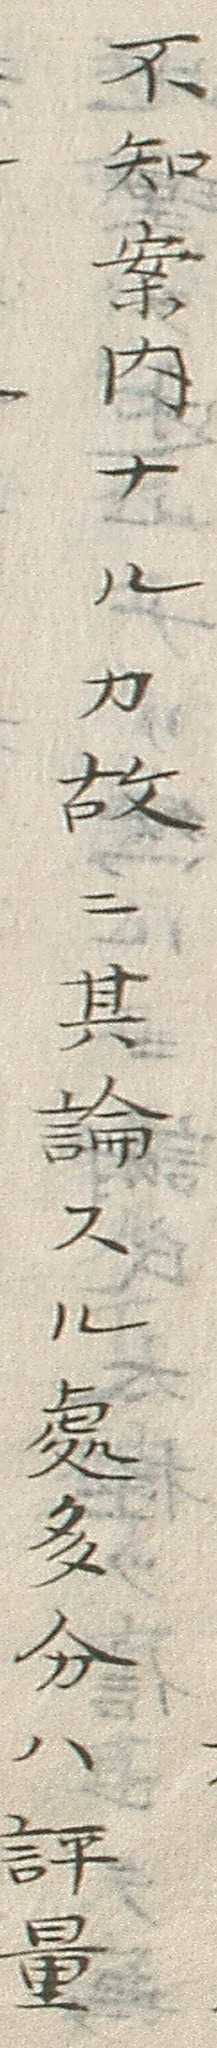不知案内ナルカ故ニ其論スル処多分ハ評量
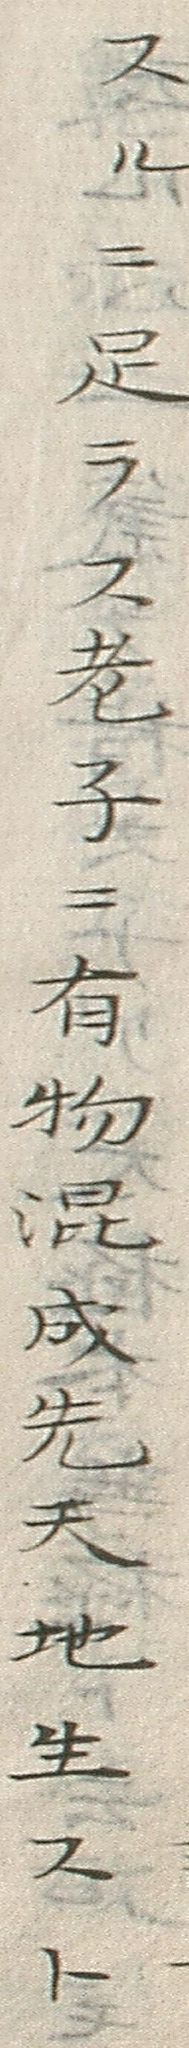スルニ足ラス老子ニ有物混成先天地生スト

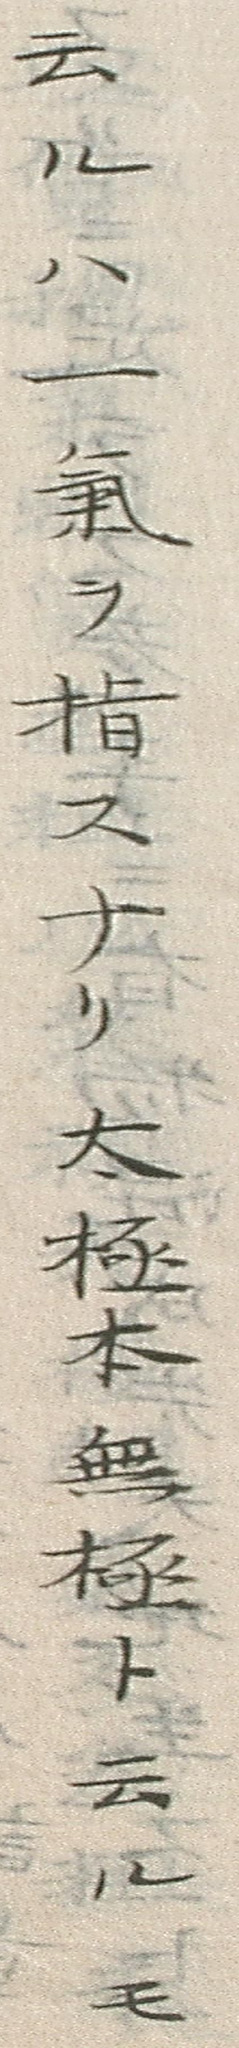云ルハ一気ヲ指スナリ太極本無極ト云ルモ
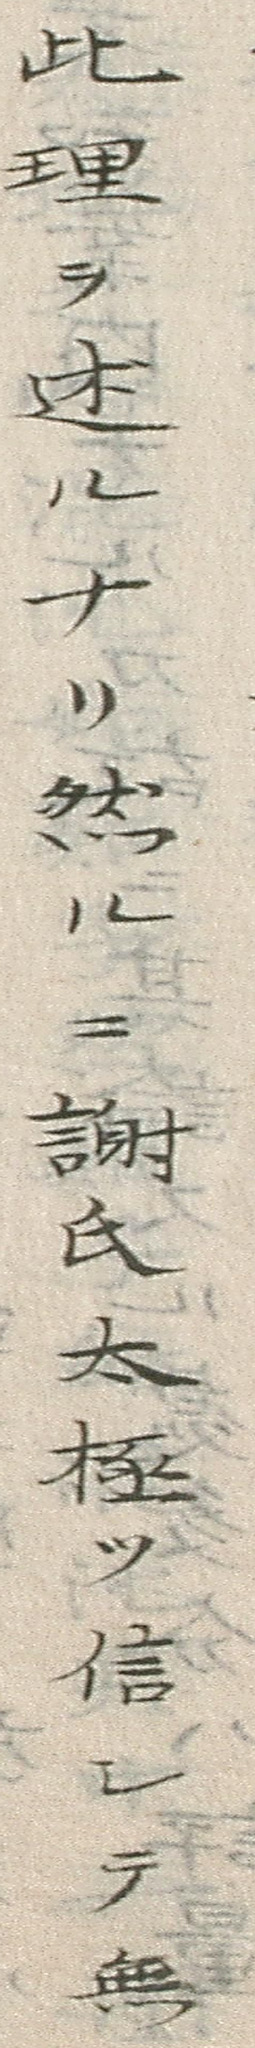此理ヲ述ルナリ然ルニ謝氏太極ッ信シテ無
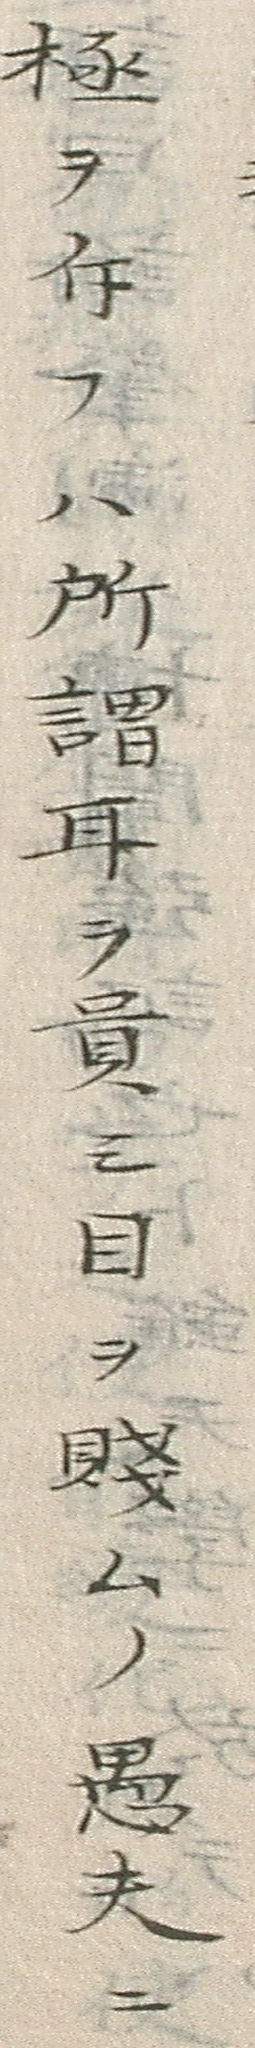極ヲ斥フハ所謂耳ヲ貴シ目ヲ賎ムノ愚夫ニ
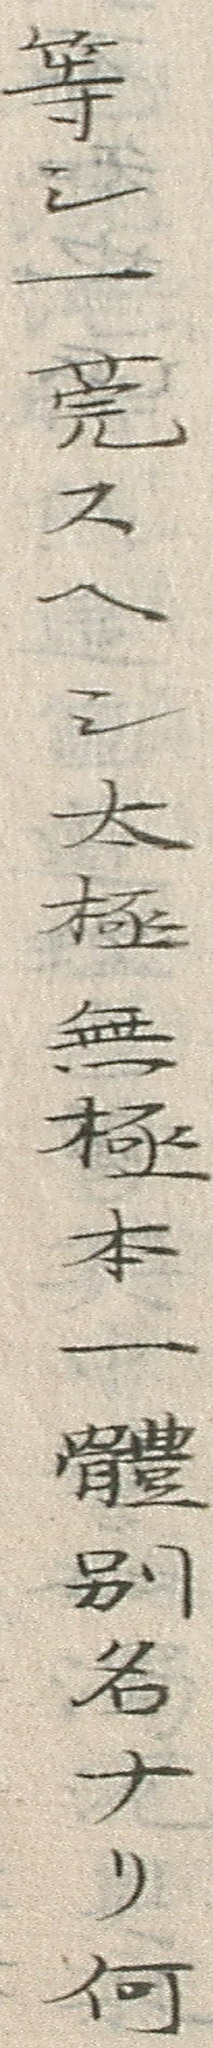等シ一莞スヘシ太極無極本一体別名ナリ何
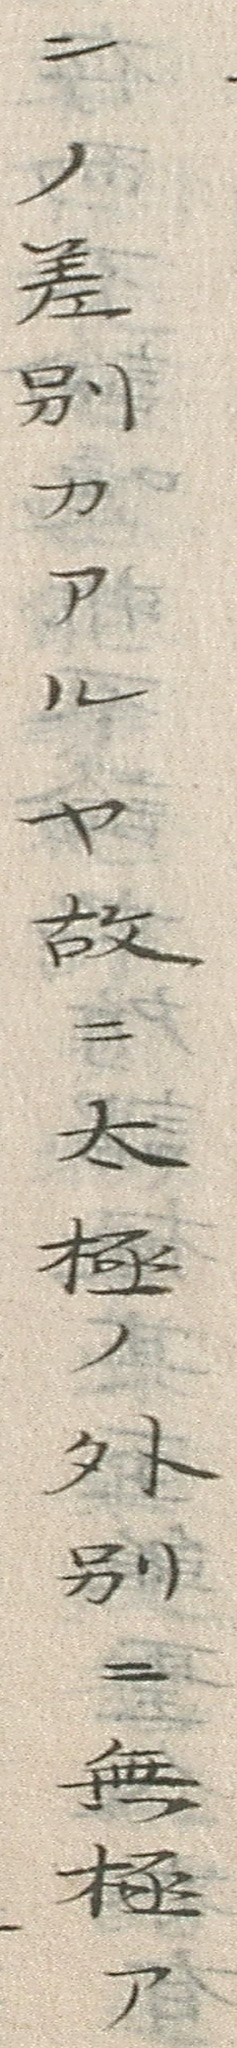ンノ差別カアルヤ故ニ太極ノ外別ニ無極ア
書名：天學略名目羽翼　全
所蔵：東京大学地震研究所図書室 Earthquake Research Institute Library, The University of Tokyo, JAPAN
